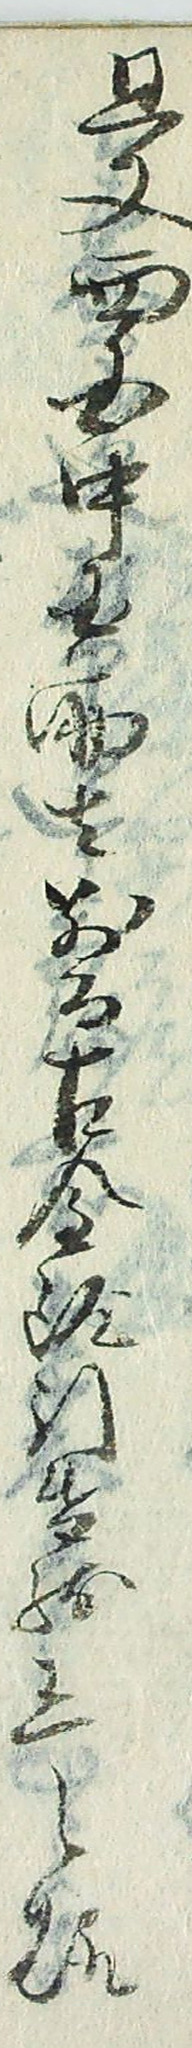且又西国中国筋は別而古金銀引替残有之趣
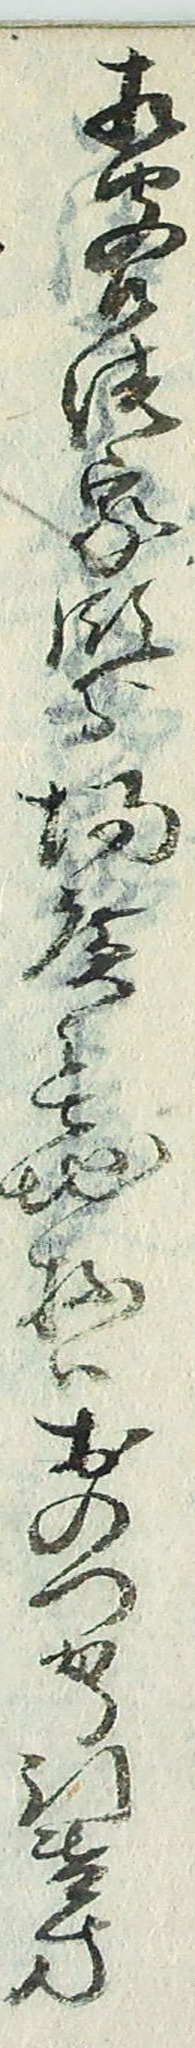相聞候諸家領分場広之土地抔はおのつから引替方
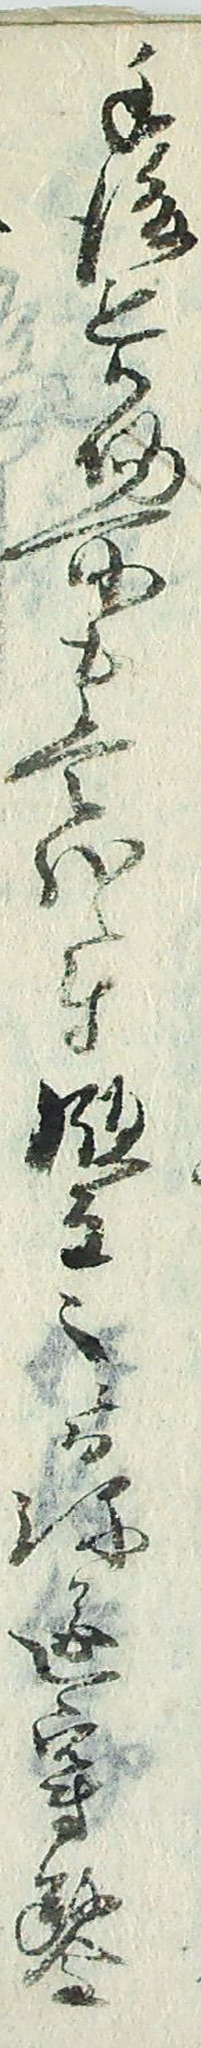手後れ候場所も有之哉に付領主々に而弥遂穿鑿
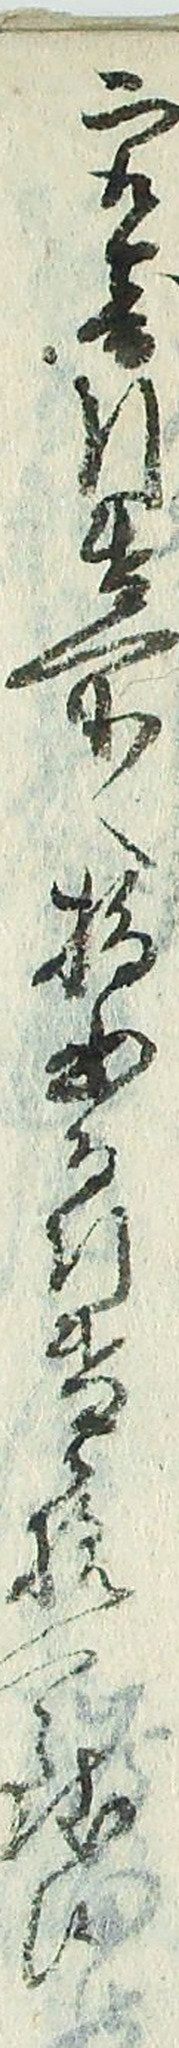最寄引替所へ指出為引替候様可致候
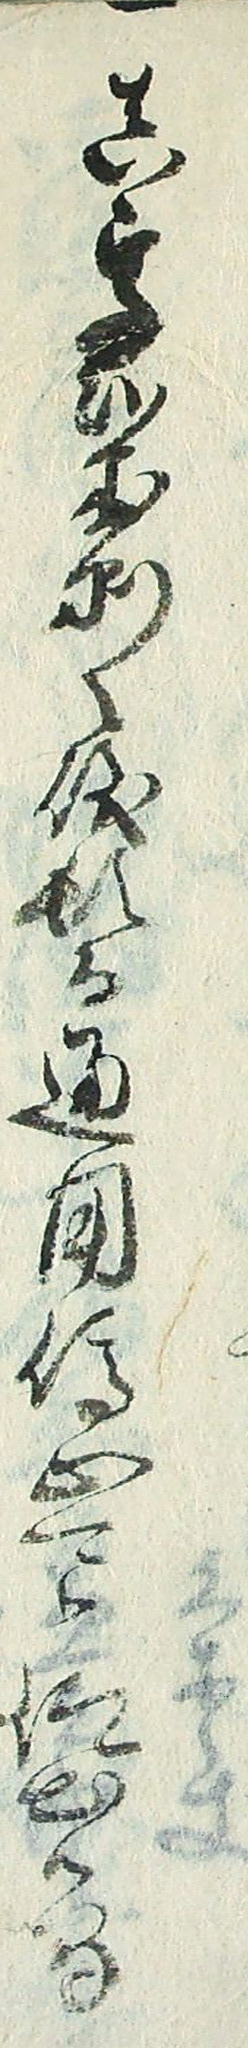真字弐歩判之儀頓と通用停止可被仰出候間
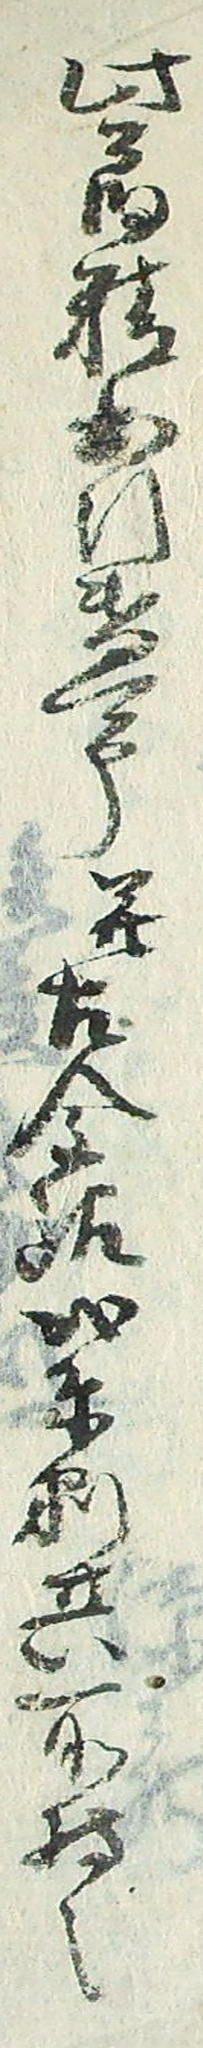此節精出引替可申幷古金銀弐朱判共所持之

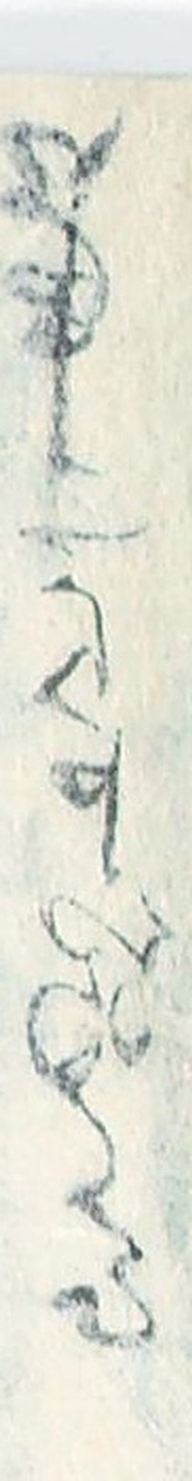十一月晦日
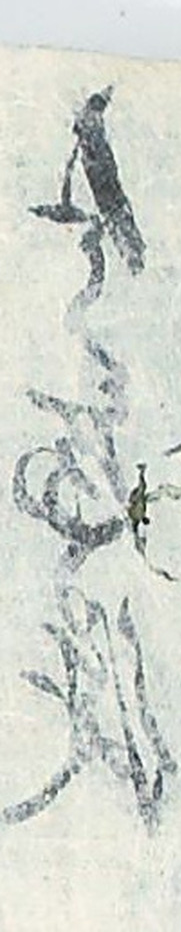十一月晦日
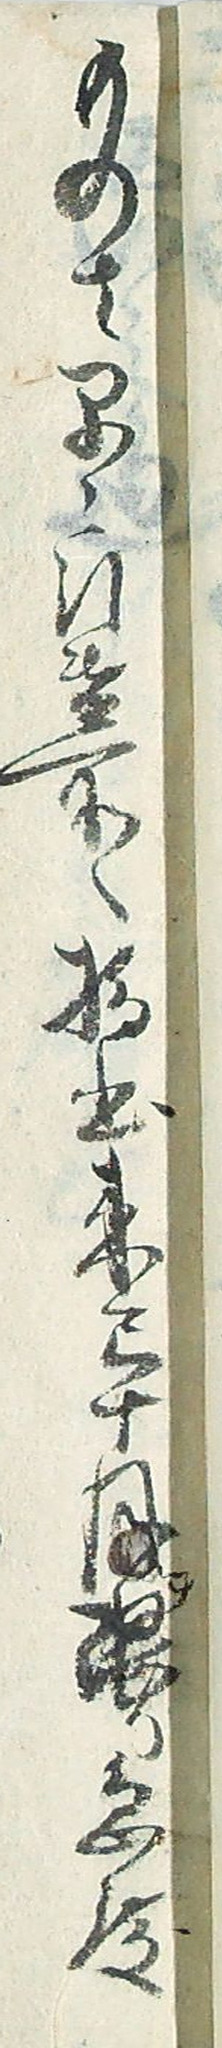ものは早々引替所へ指出来巳十月を限り急度
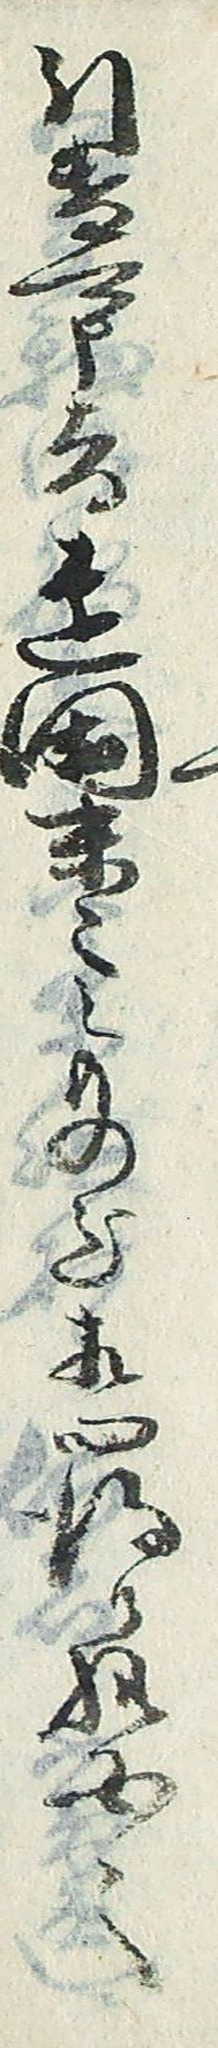引替可申旨遠国末々之もの迄相心得候様国々
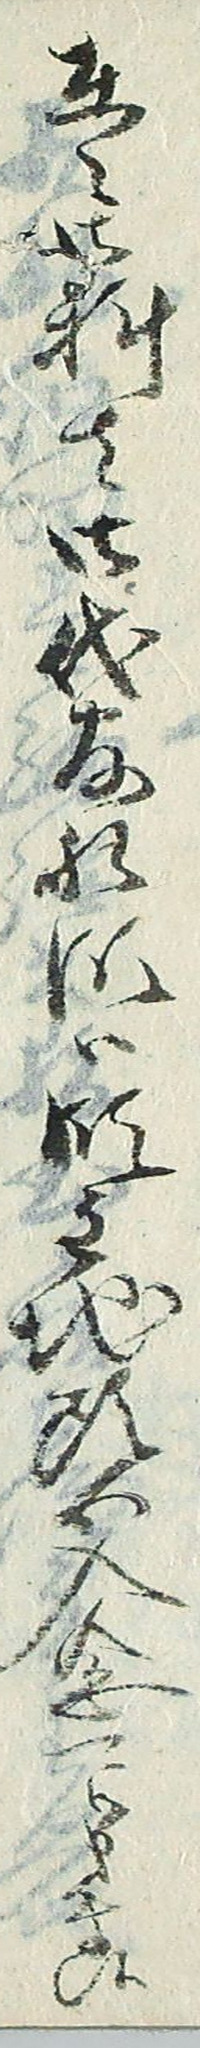在々御料は御代官私領は領主地頭ゟ入念可被申付候
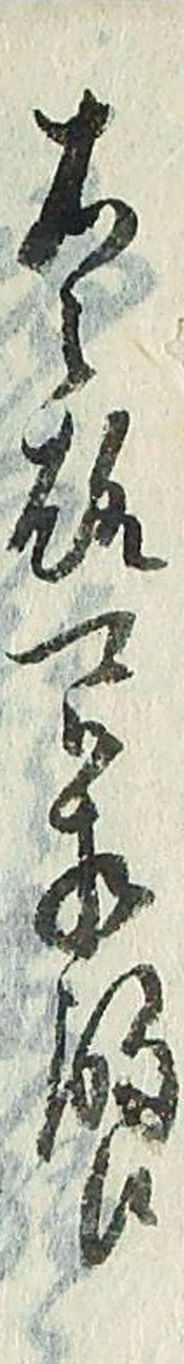右之趣可被相触候
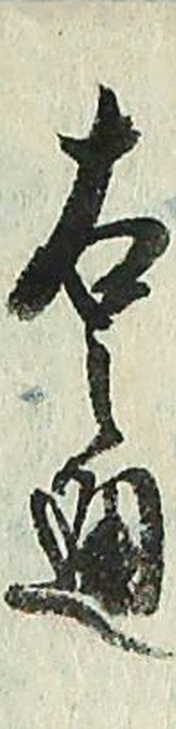右之通
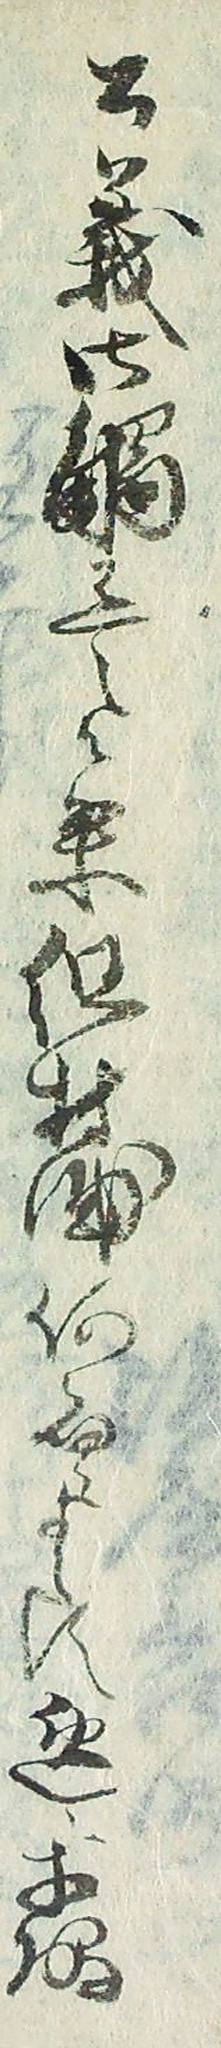公儀御触有之候条組村浦何者によらす逸々相触
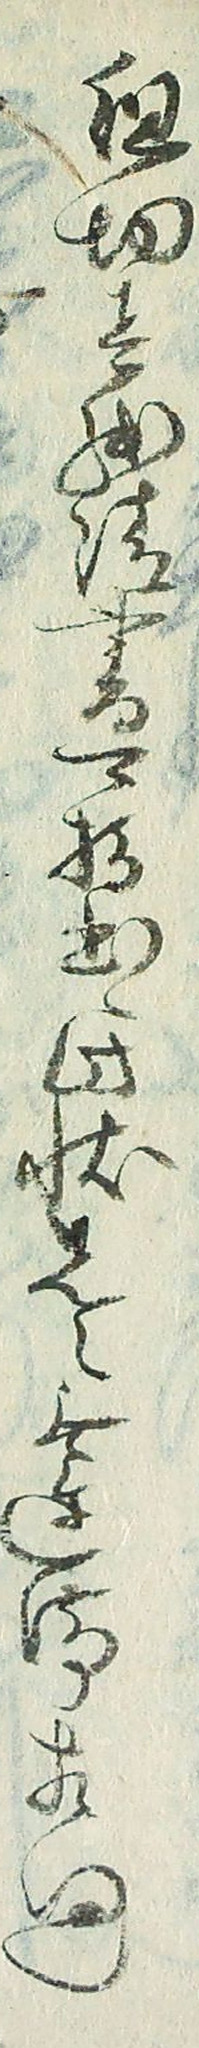組切壱紙請書可指出候此状先々無遅滞相廻
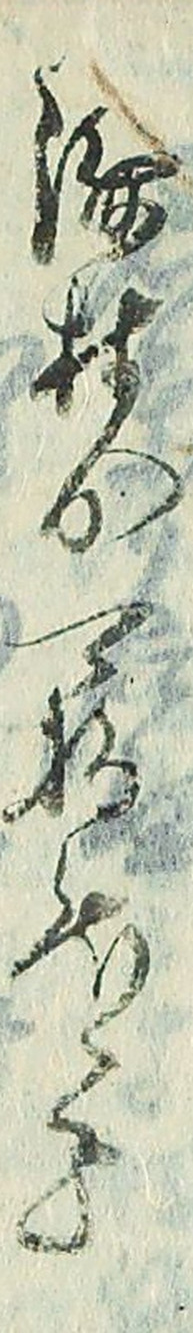済村ゟ可指戻候以上
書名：諸御用御□受書控
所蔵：鳴門教育大学 Naruto University of Education
